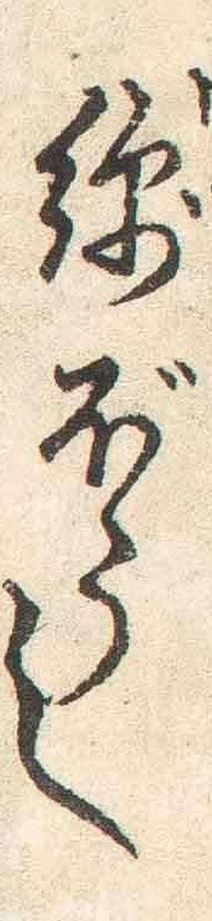綿ぼうし
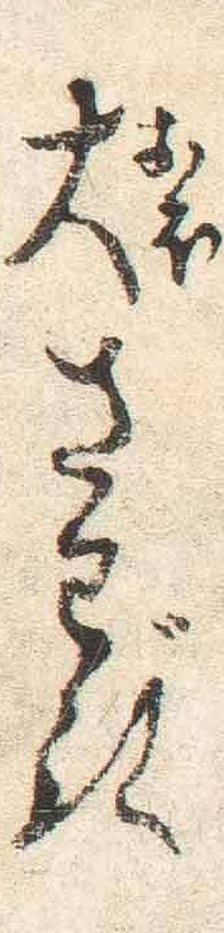大さわぎ
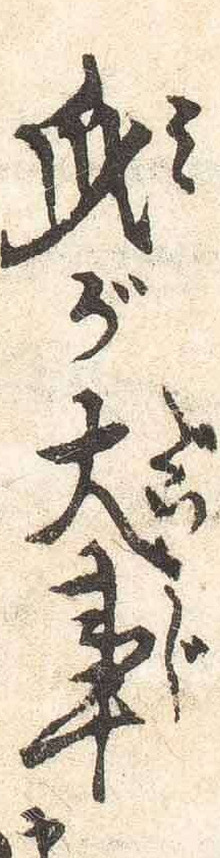身が大事
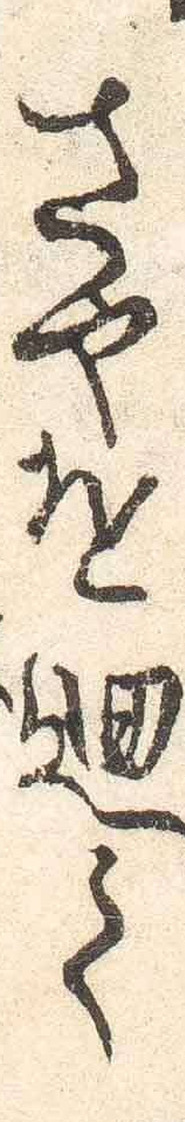さやを廻て
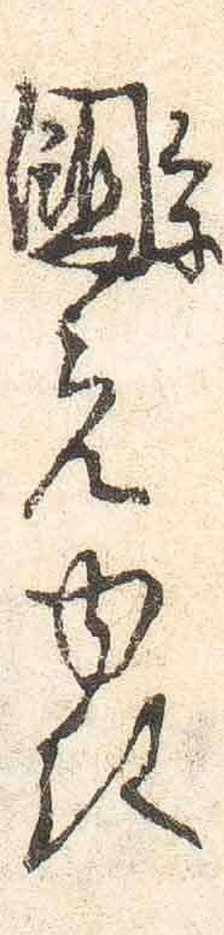国えゆき
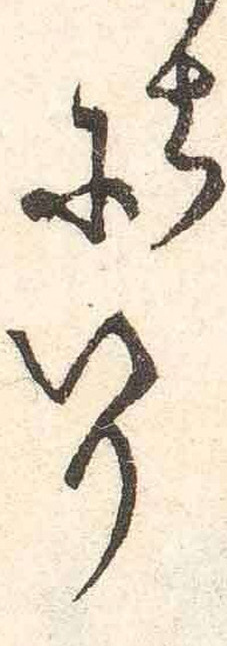にいり
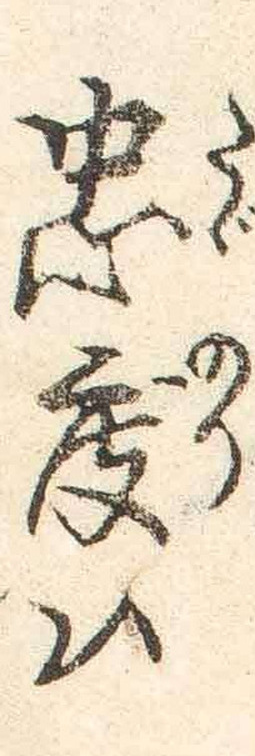忠度は
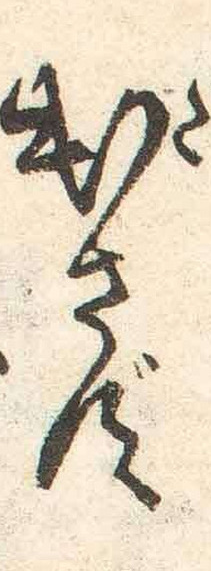出さず
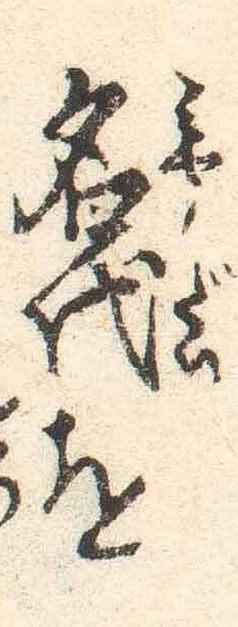名代を
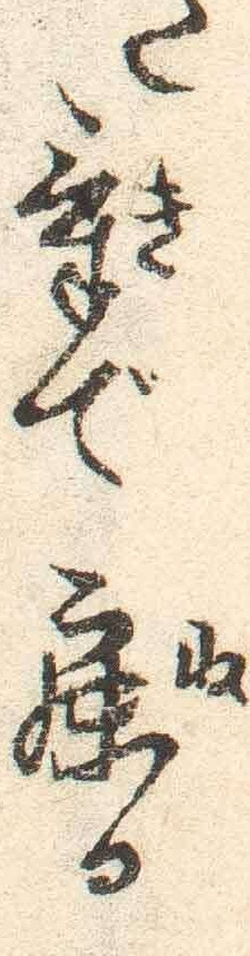気で寝る

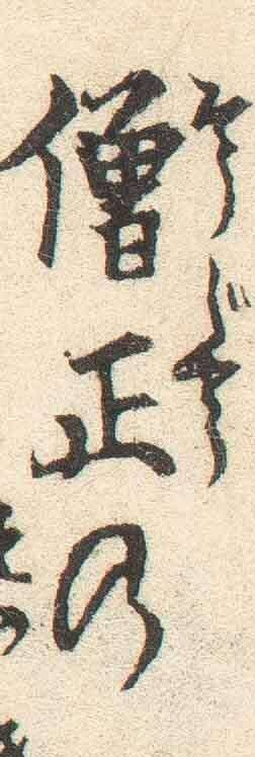僧正の
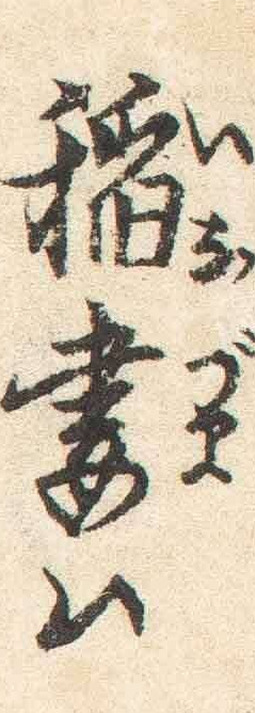稲妻は
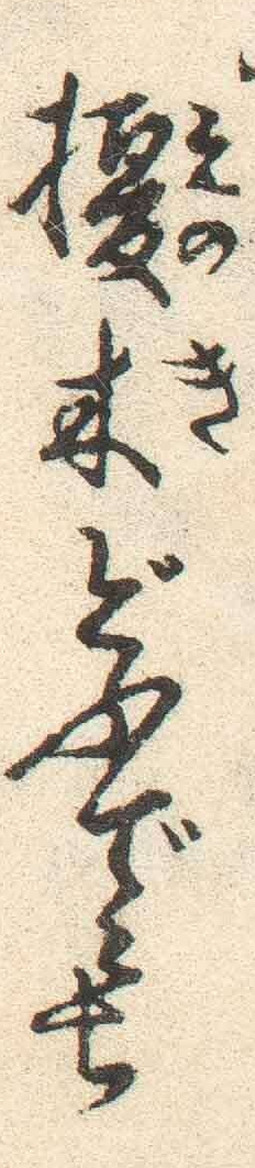榎木どうでも
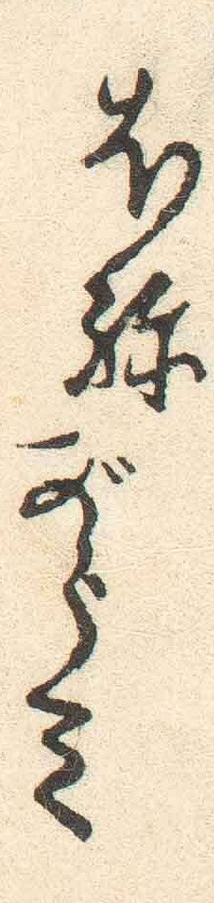ほねがらみ
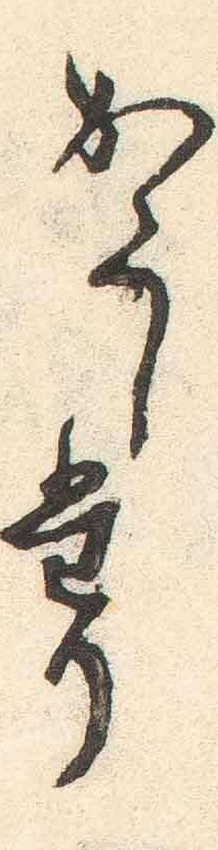かくしたり
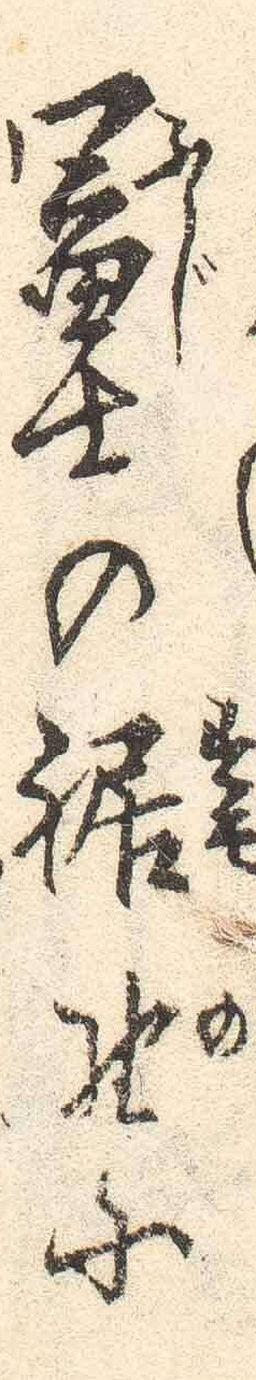富士の裾野に
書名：画本柳樽
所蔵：東京学芸大学附属図書館 国文学研究資料館
